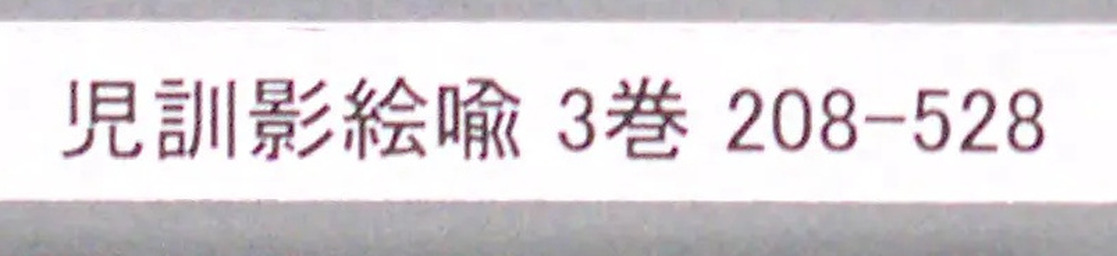児訓影絵喩完
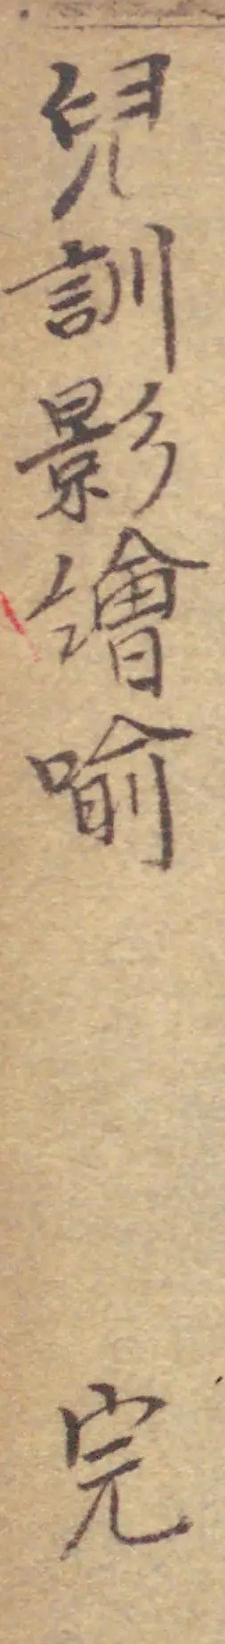児訓影絵喩完

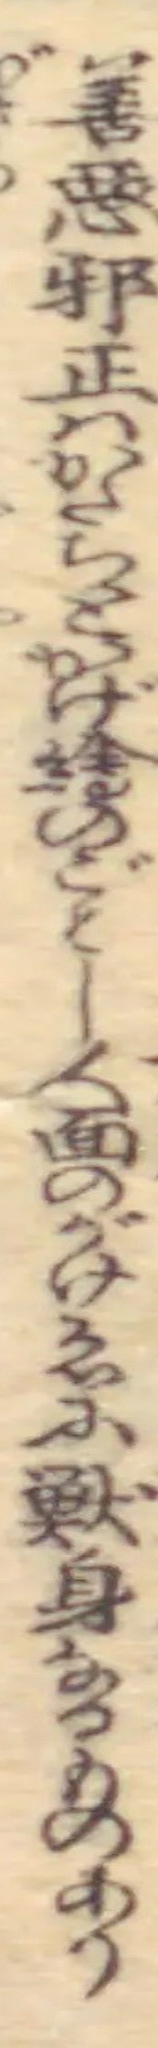善悪邪正はかたちとかげ絵のごとし人面のかげゑに獣身なるものあり
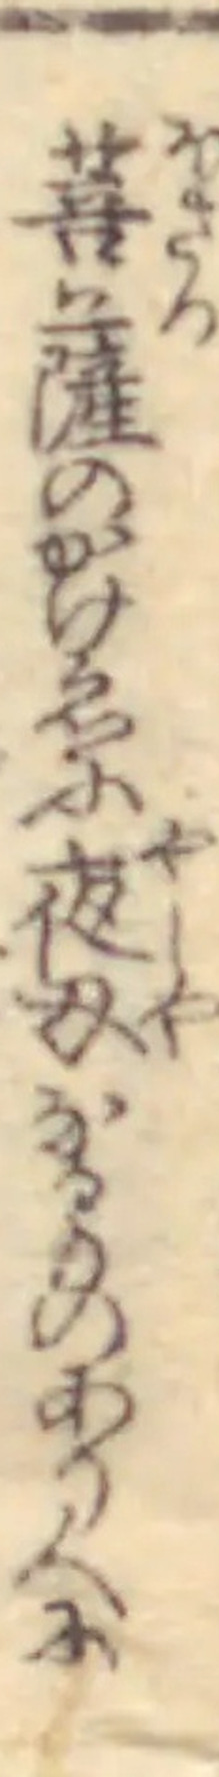菩薩のかけゑに夜叉なるものあり人に
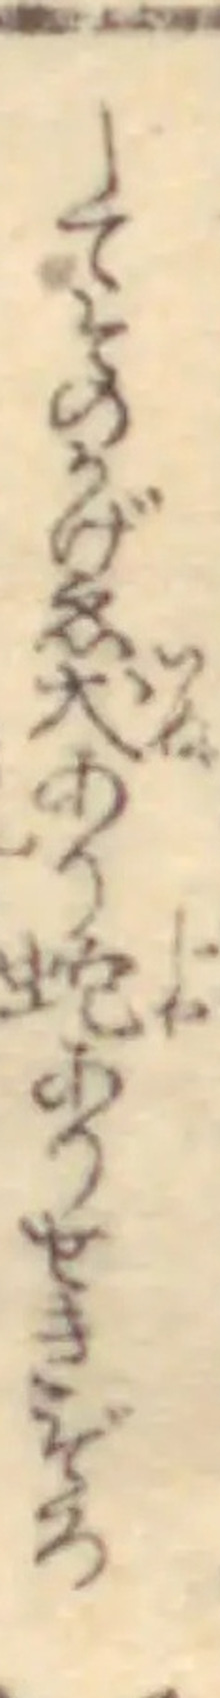してそのかげゑ犬あり蛇ありせきぞろ
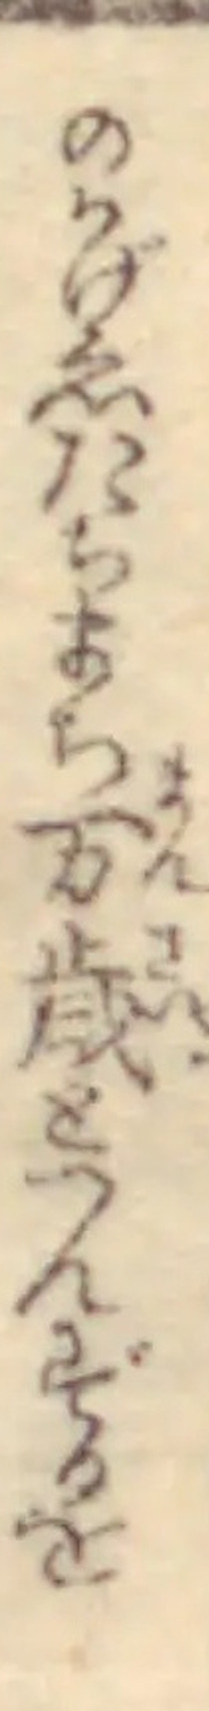のかげゑたちまち万歳とへんずるを
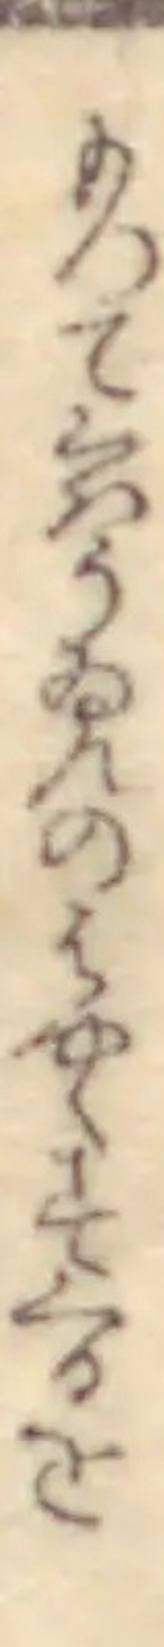もつてくはうゐんのはやくすくるを
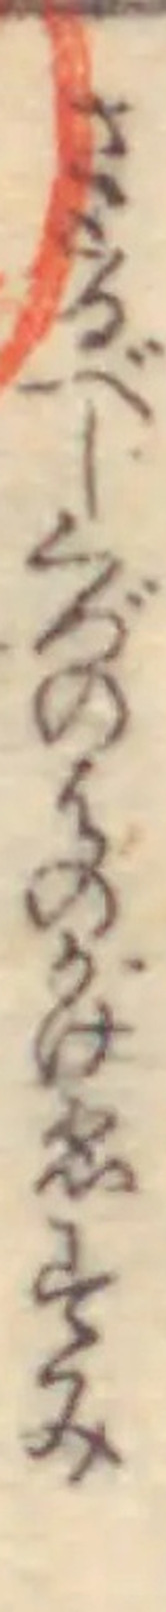さとるべしくづのはのかげゑすみ
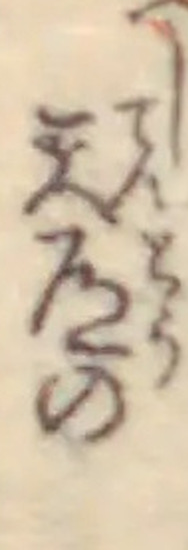天道の
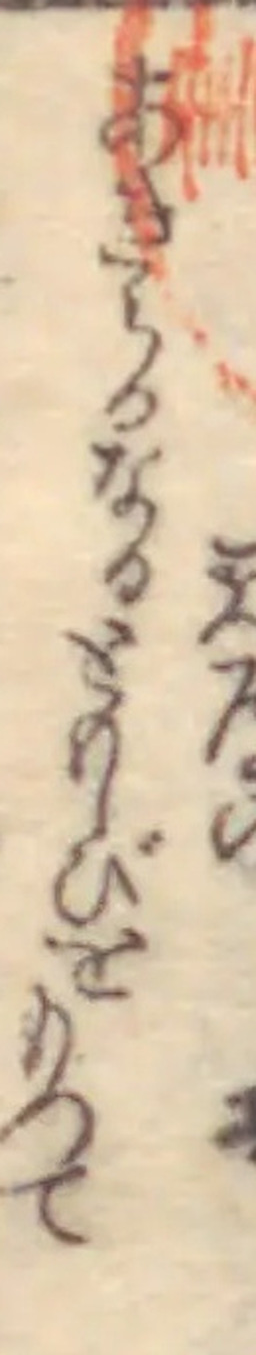あきらかなるともしびをもつて
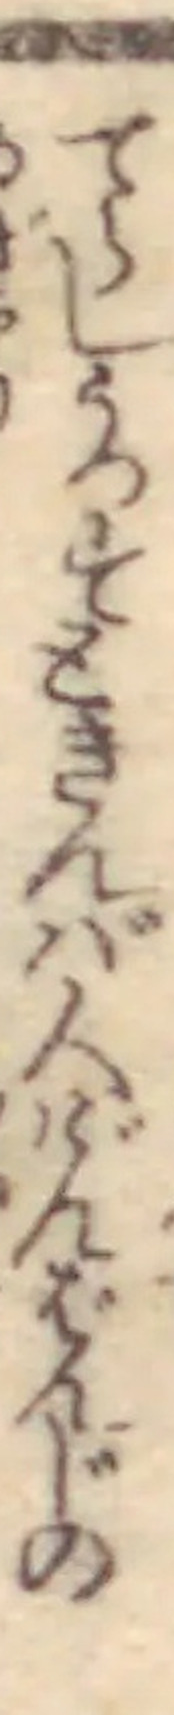てらしうつすときんば人げんばんじの
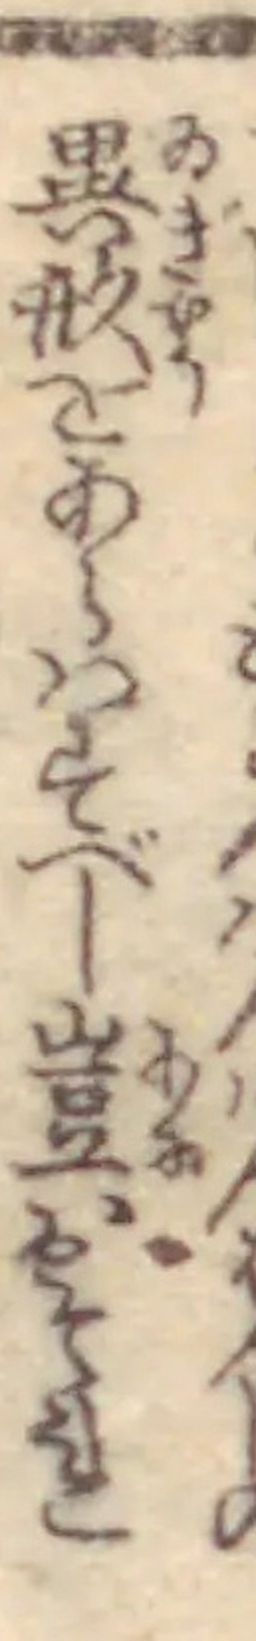異形をあらはすべし豈おそれ
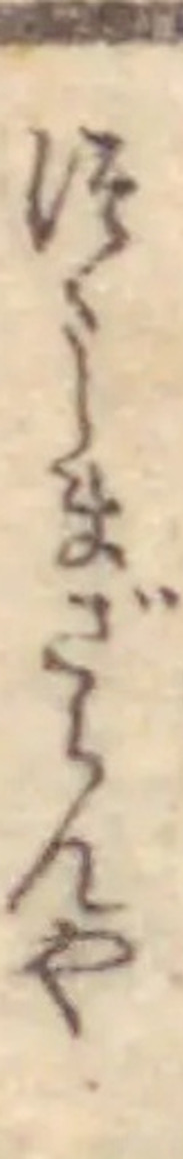つゝしまざらんや
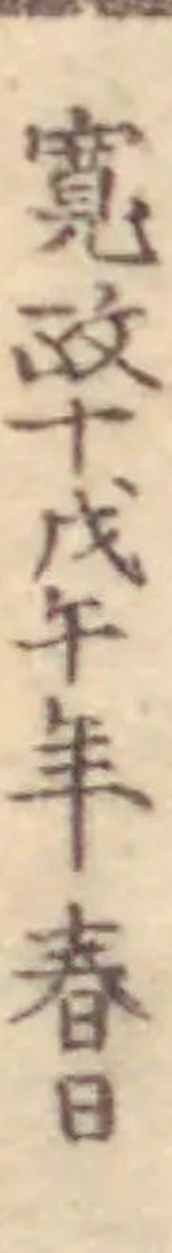寛政十戊午年春日
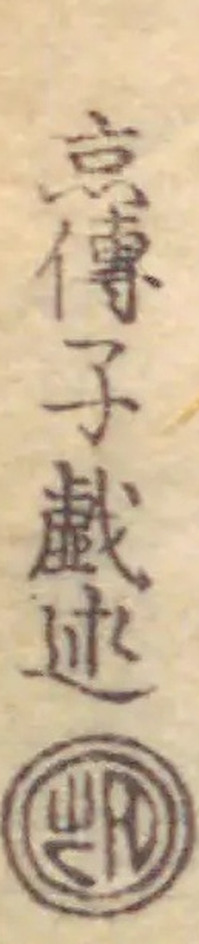京伝子戯述

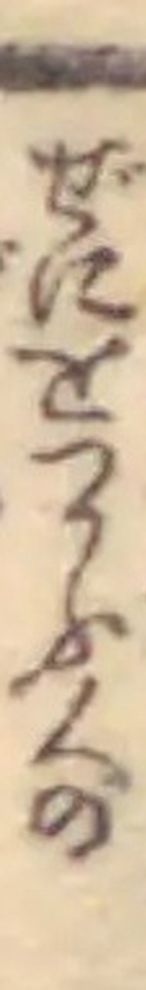ぜにをつかふ人の
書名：児訓影絵喩 3巻
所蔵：国立国会図書館 National Diet Library, JAPAN
